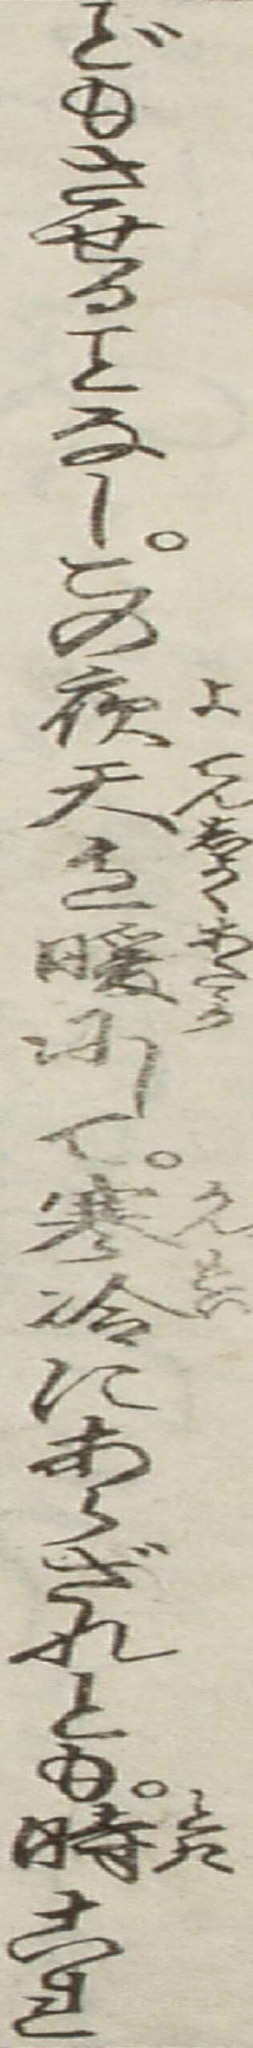どもさせることなし。この夜天色暖にして。寒冷にあらざれとも。時これ
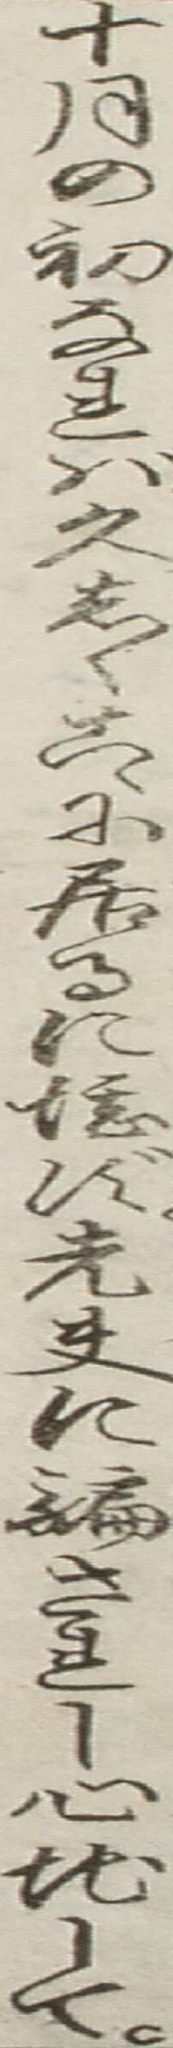十月の初なれば。久しくこゝに居るに堪ず。老夫に騙されし心地して。
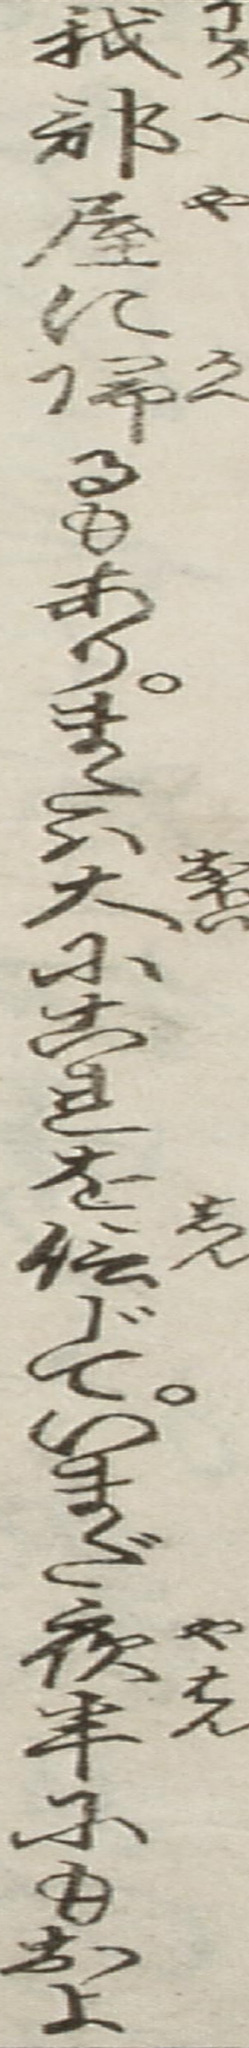我部屋に帰るもあり。または大にこれを信じて。いまだ夜半にもおよ
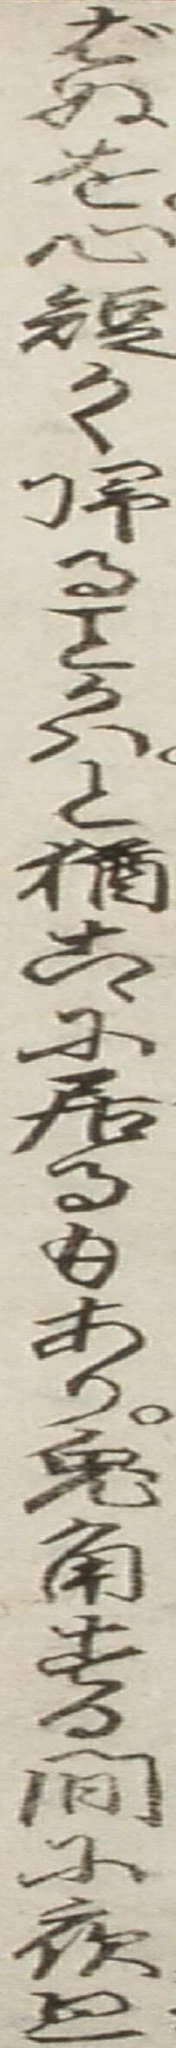ばぬを。心短かく帰ることかは。と猶こゝに居るもあり。兎角する間に夜廻
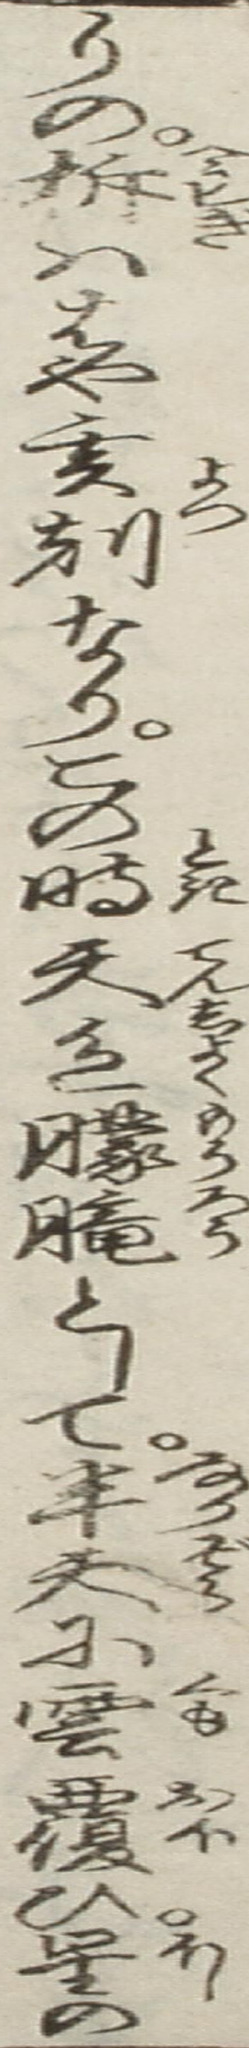りの。柝ははや亥刻なり。この時天色朦朧として。半天に雲覆ひ。星の
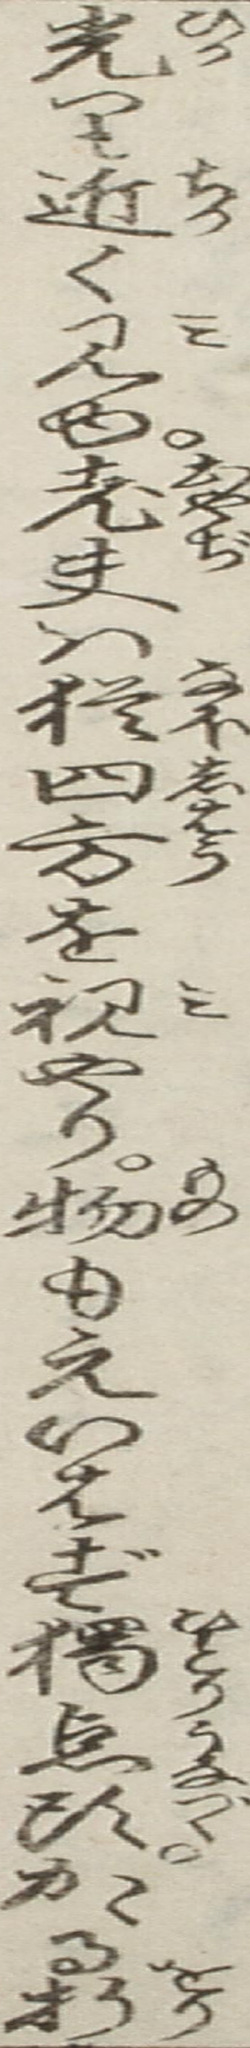光り近く見ゆ。老夫は猶四方を視やり。物もえいはず独点頭。かゝる折
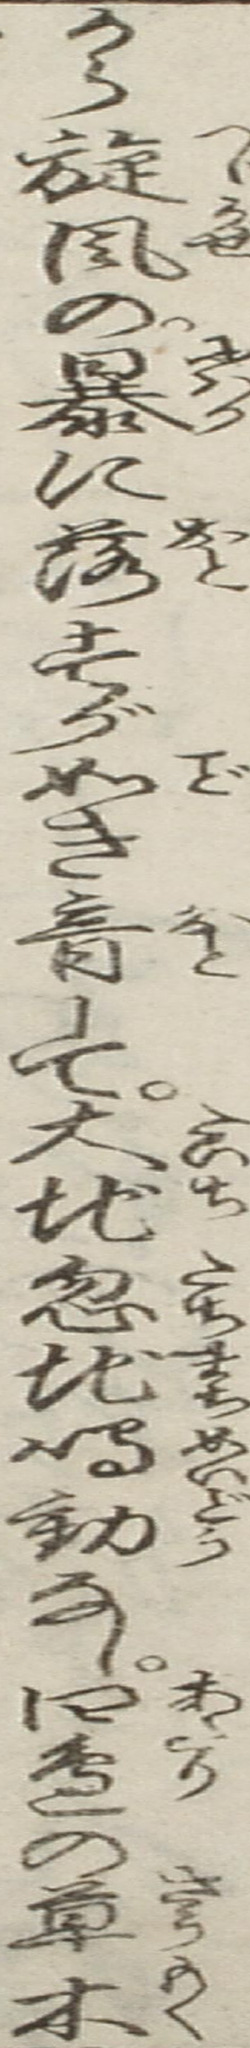から旋風の。暴に落すが如き音して。大地忽地鳴動なし。四辺の草木
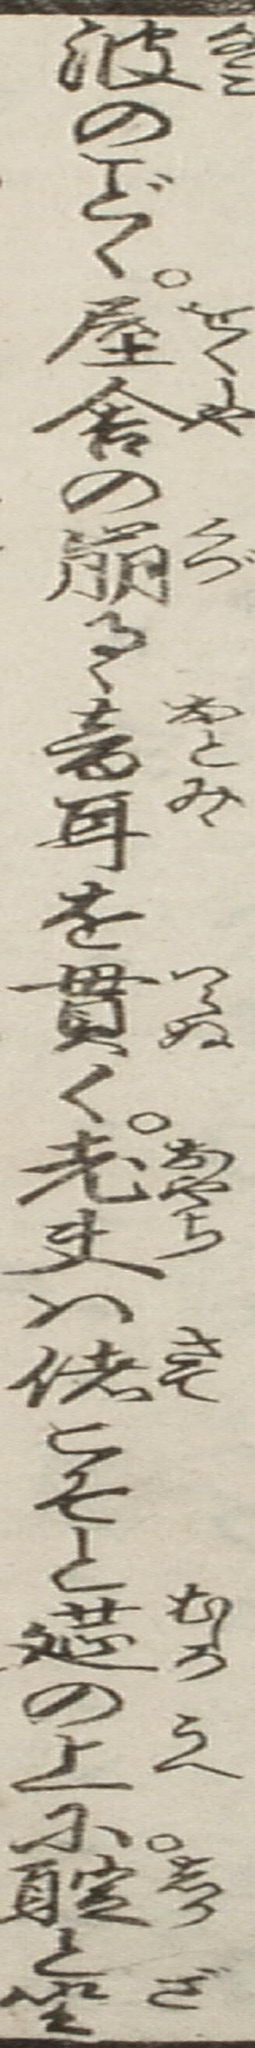波のごとく。屋舎の崩るゝ音耳を貫く。老夫は偖こそと筵の上に。聢と坐
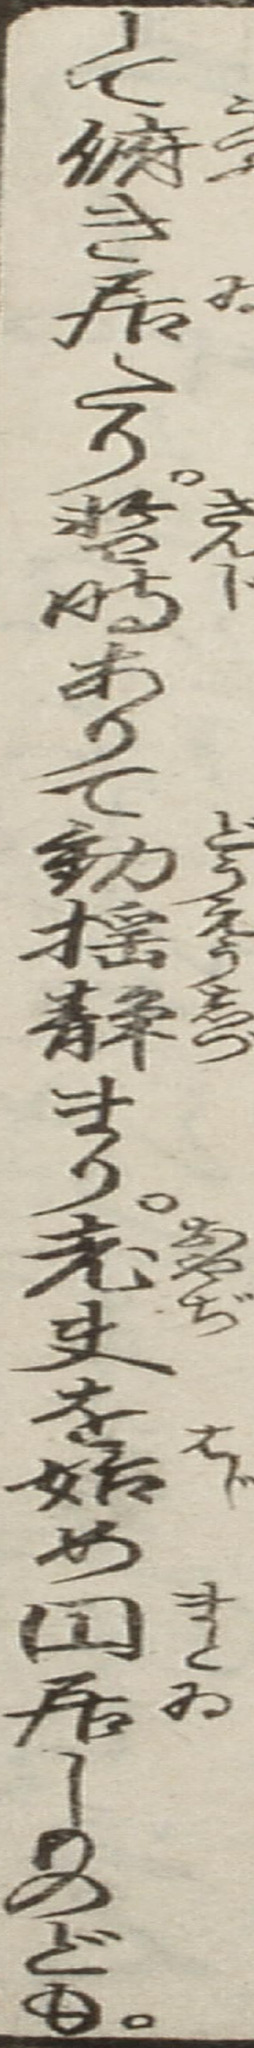して俯き居たり。暫時ありて動揺静まり。老夫を始め円居しものども。
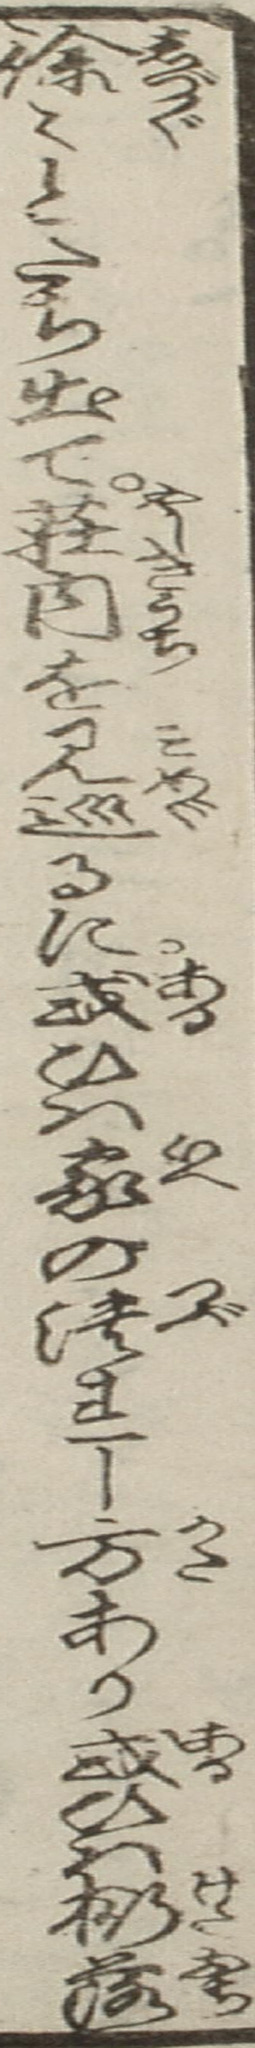徐〻とたち出て。荘内を見巡るに。或ひは家の潰れし方あり或ひは桁落
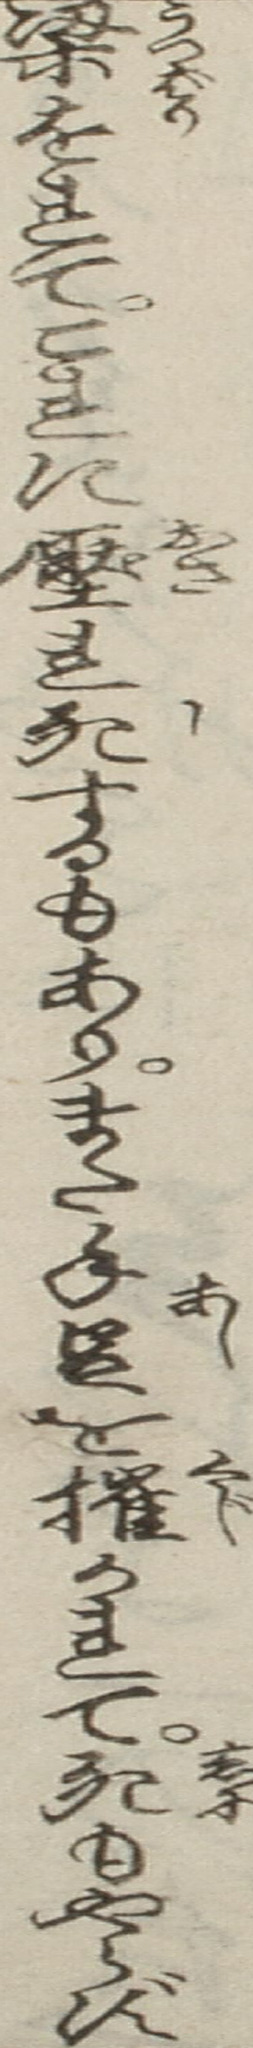梁をれて。これに圧れ死するもあり。また手足を摧かれて。死もやらず
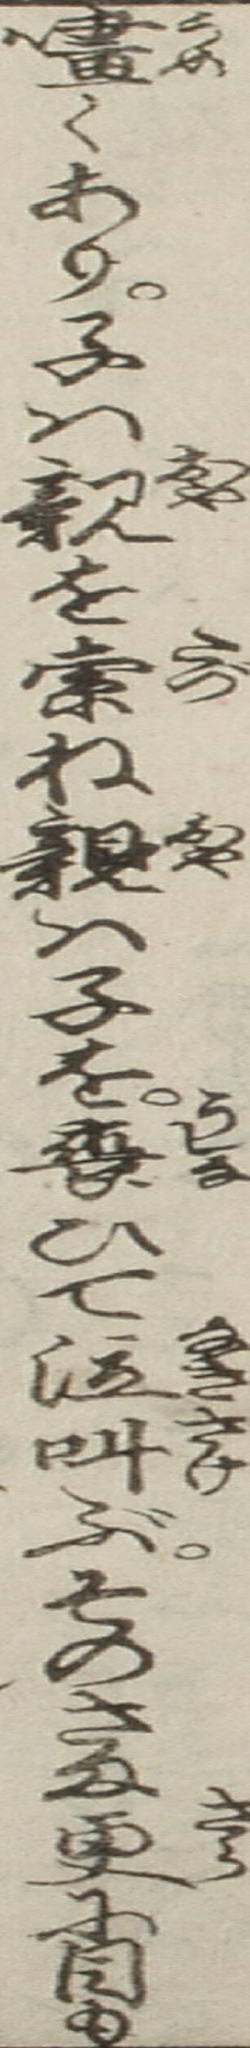㗲うめくあり。子は親を索ね親は子を。喪ひて泣叫ぶ。そのさま更に目も
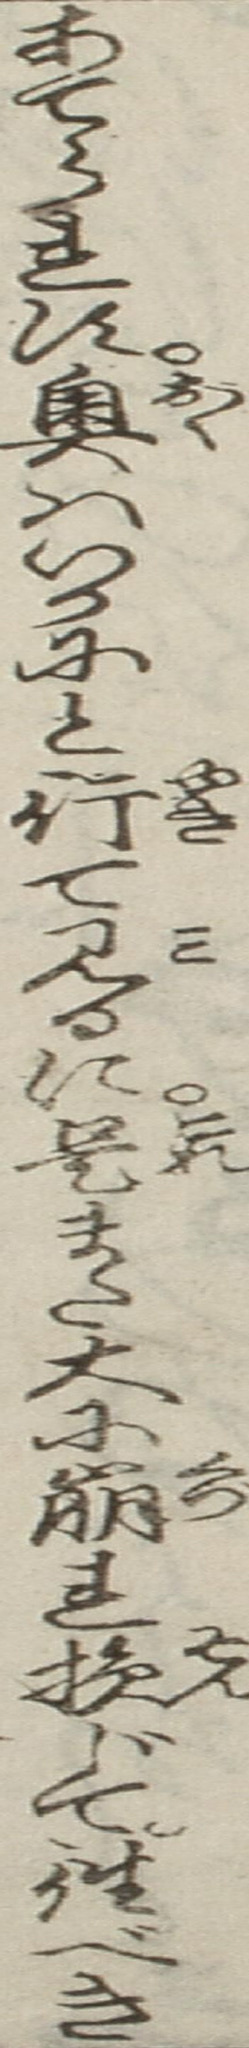あてられす。奥はいかにと行て見るに。是また大に崩れ損じて。往べき
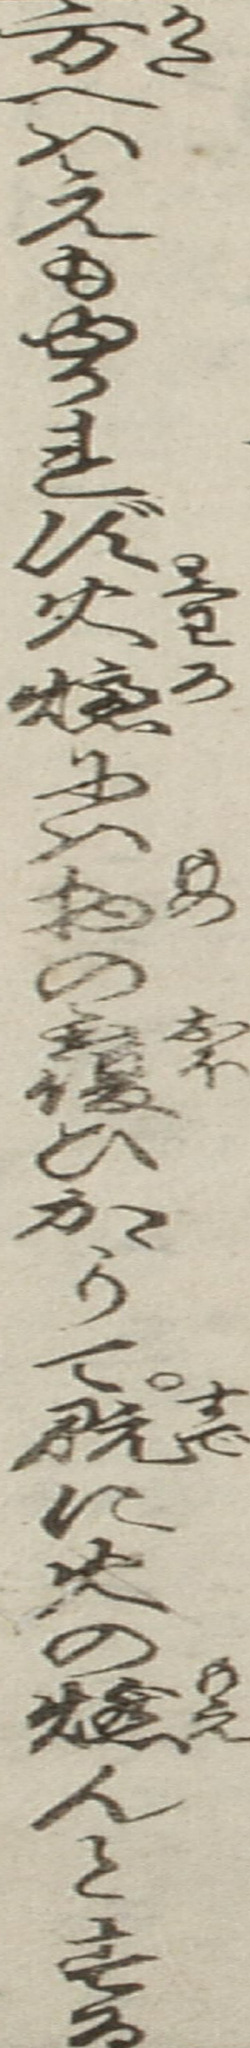方へはえもゆかれず。火爐には物の覆ひかゝりて。既に火の燃んとする
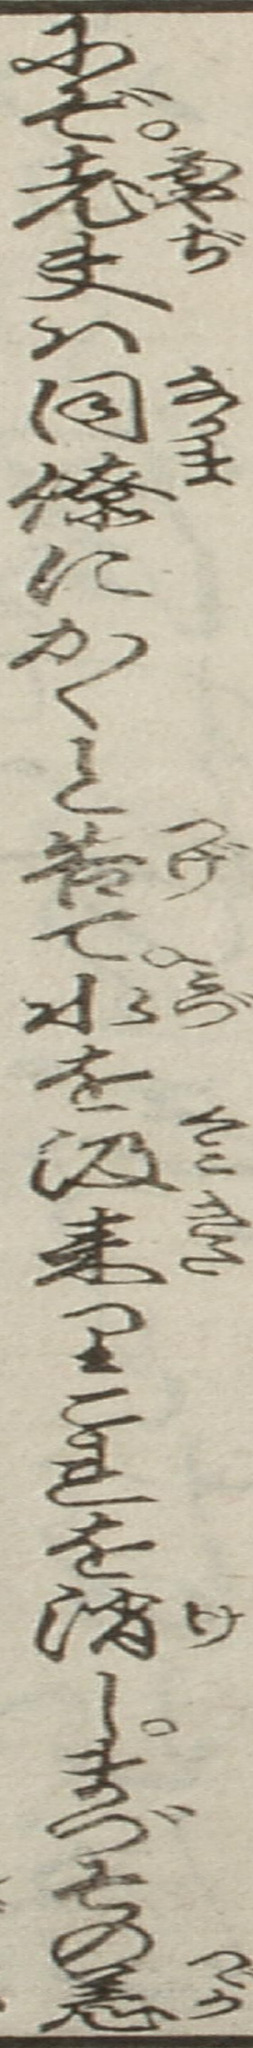にぞ。老夫は同僚にかくと告て。水を汲来りこれを消し。まづその恙
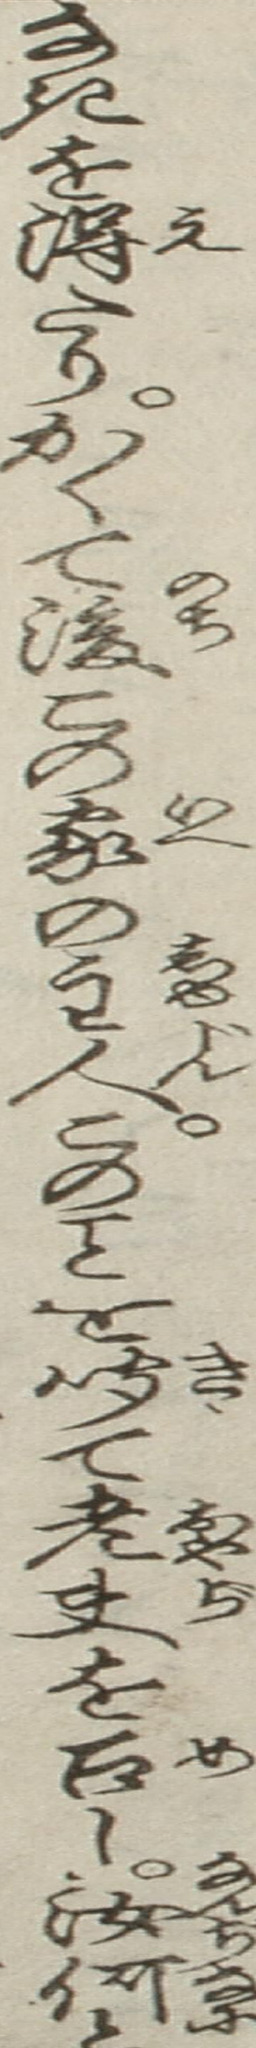なきを得たり。かくて後この家の主人。このことを聞て老夫を召し。汝何と
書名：安政見聞録　上
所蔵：東京大学地震研究所図書室 Earthquake Research Institute Library, The University of Tokyo, JAPAN
